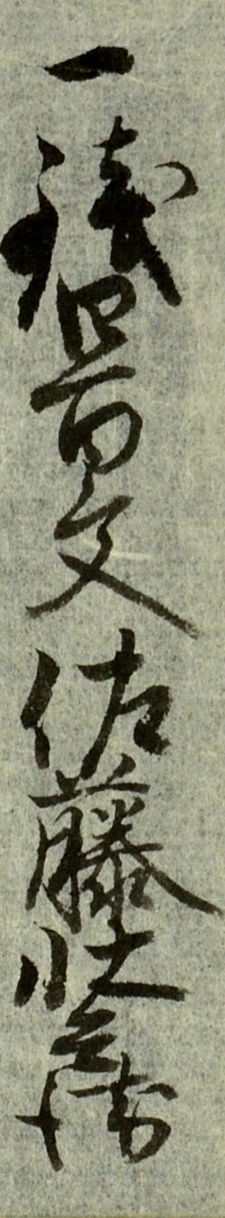一銭四百文佐藤壮兵衛
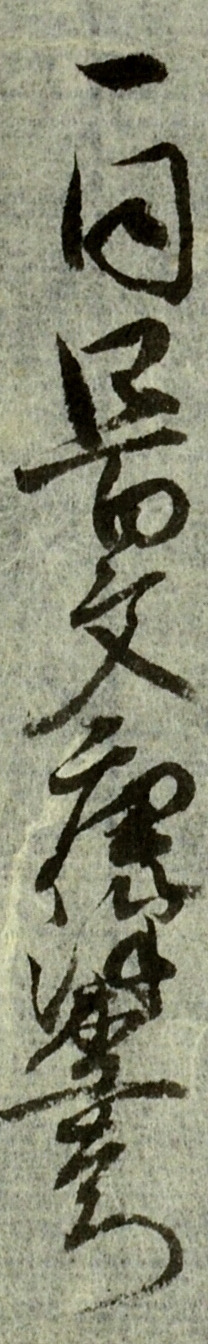一同四百文唐沢杢右衛門
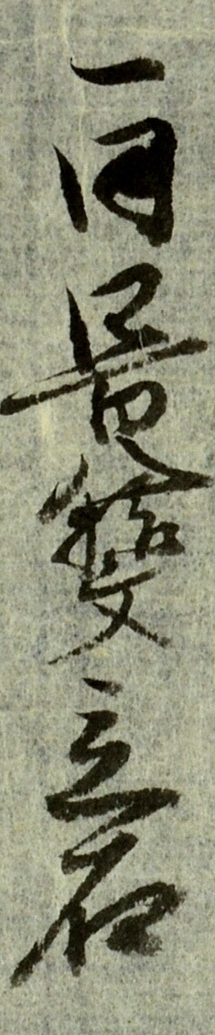一同四百八拾文立石
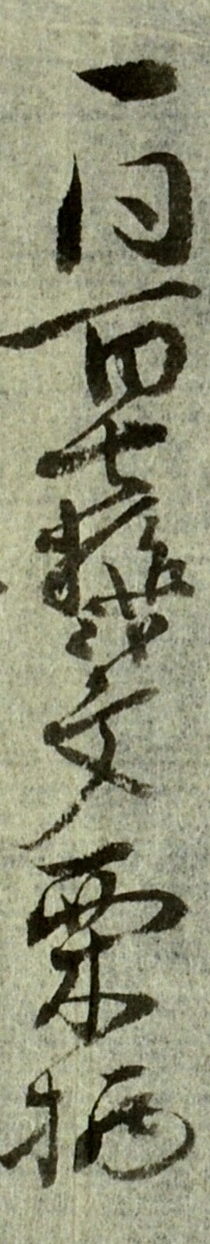一同百七拾弐文栗栖
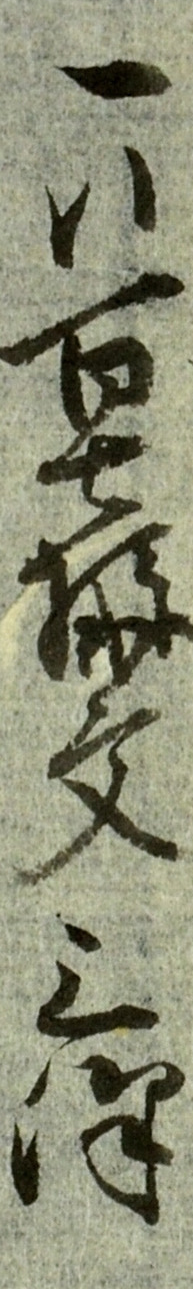一同百七拾弐文三沢
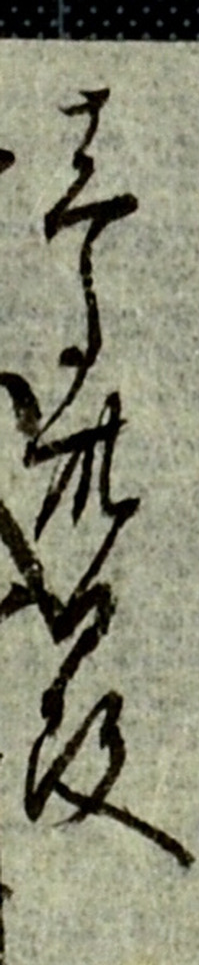十二月卅日改
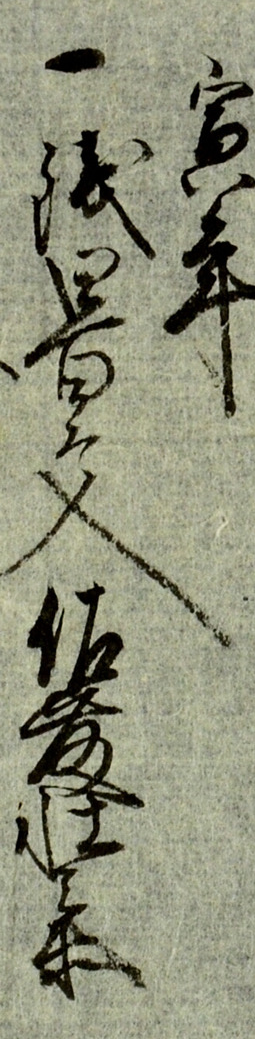一銭四百文佐藤壮兵衛
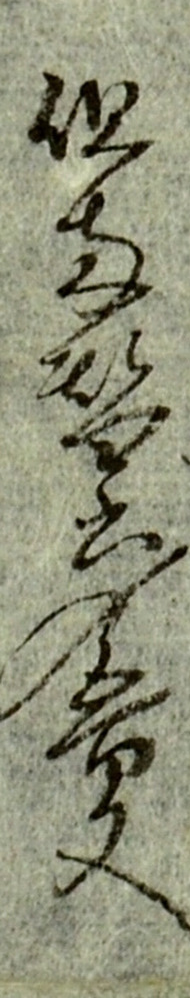但両替六〆五百文

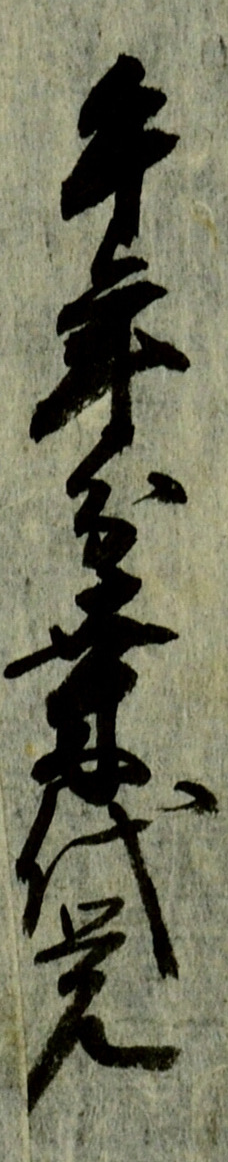午年分桑代覚
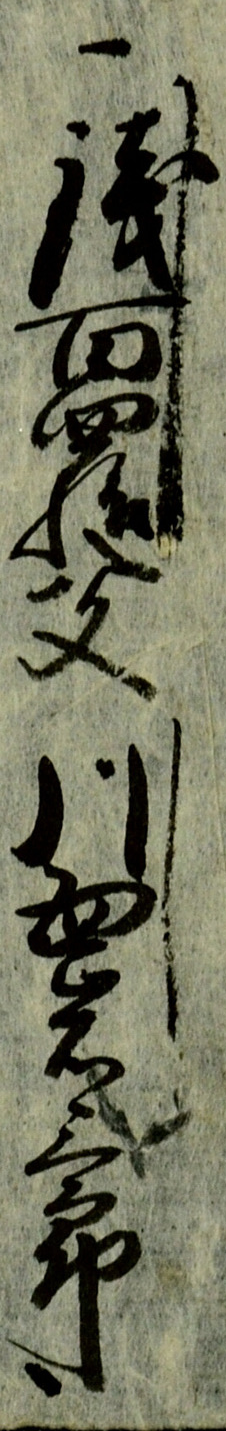一銭百四拾八文川西岩三郎
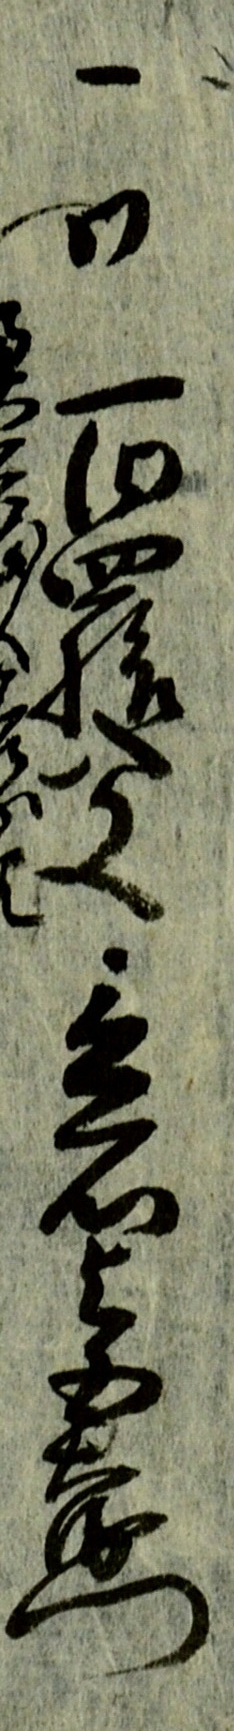一同百四拾八文立石与五右衛門
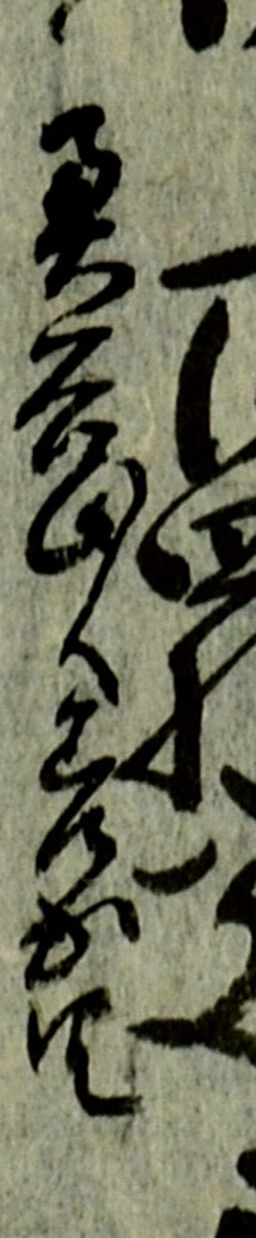奥谷氏へ差出置
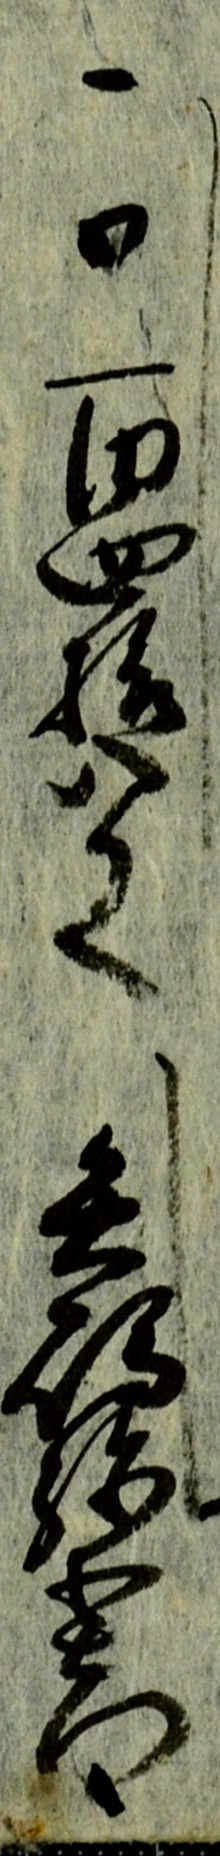一同百四拾八文矢島弥五右衛門
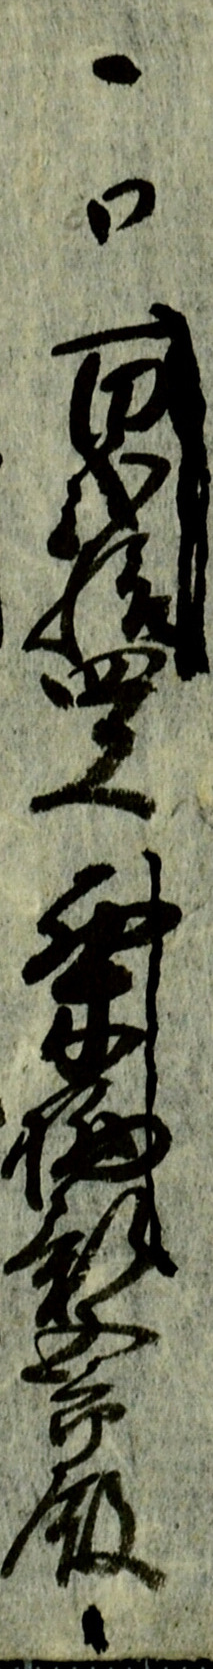一同百弐拾四文栗栖新五郎殿
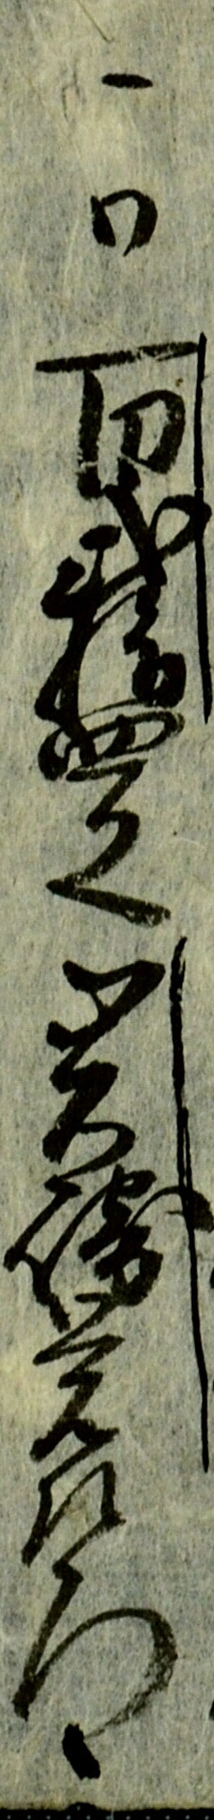一同百弐拾四文岩崎覚左衛門
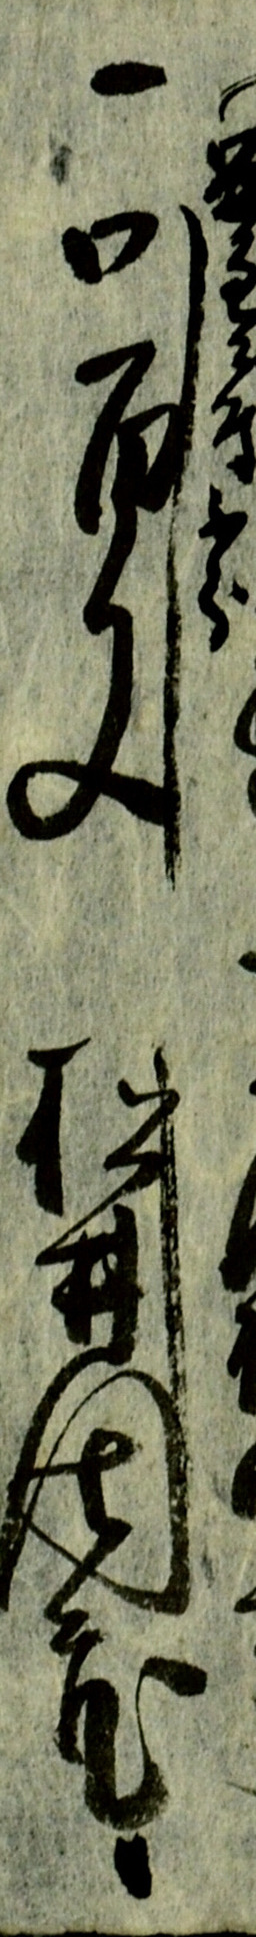一同百文松井周蔵
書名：覚
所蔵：伊那市立高遠町図書館・合同会社AMANE
